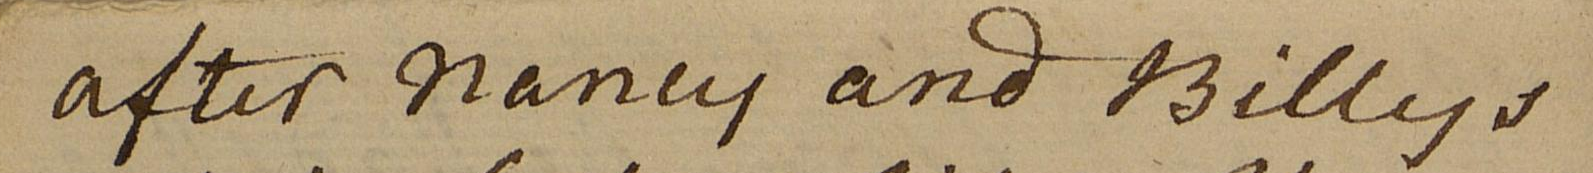after Nancy and Billys
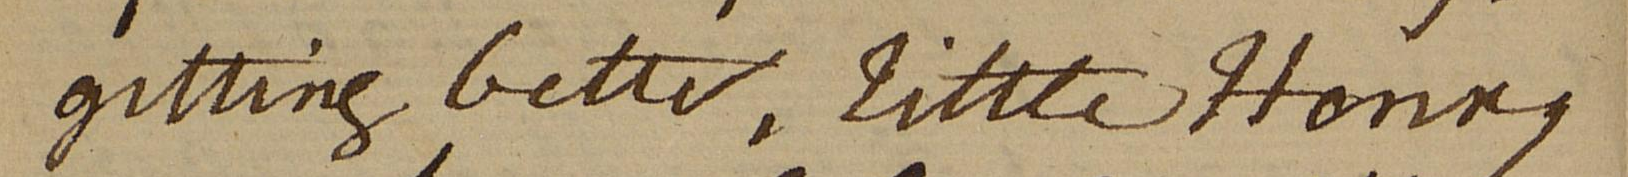gitting better, little Henry
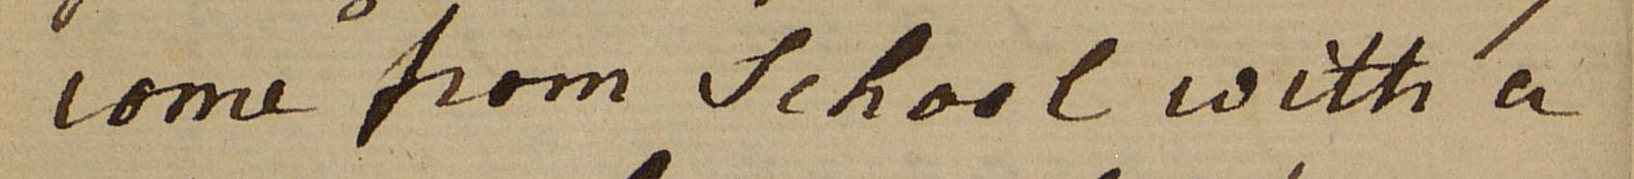come from School with a
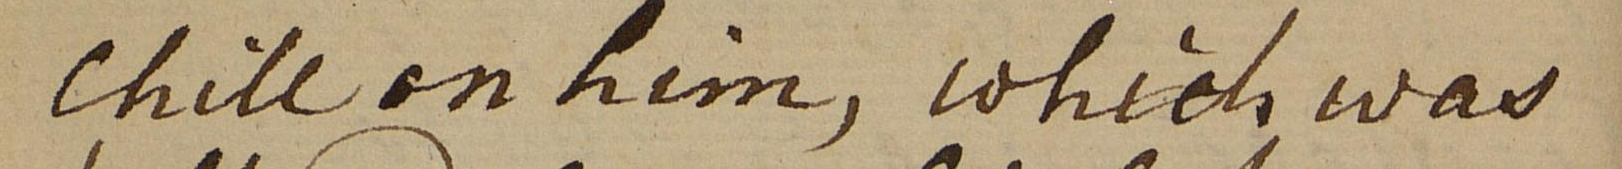Chill on him, which was
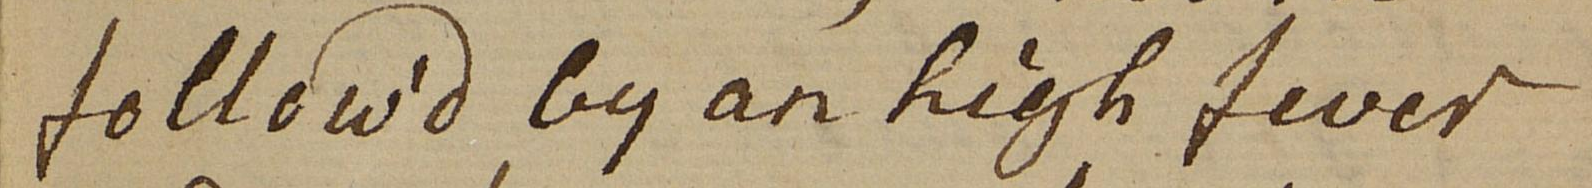follow'd by an high fever
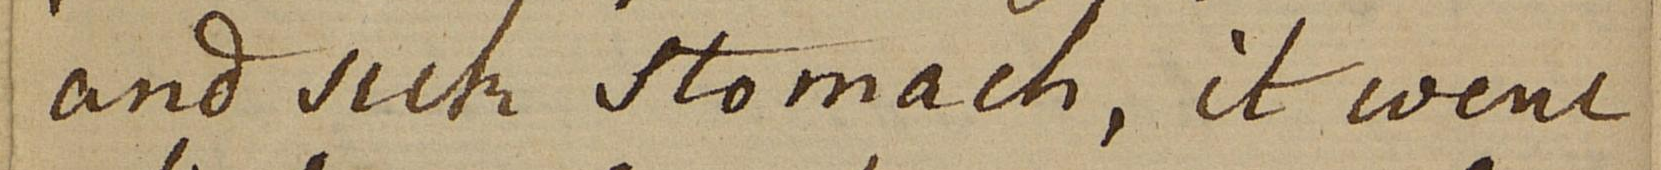and sick stomach, it went
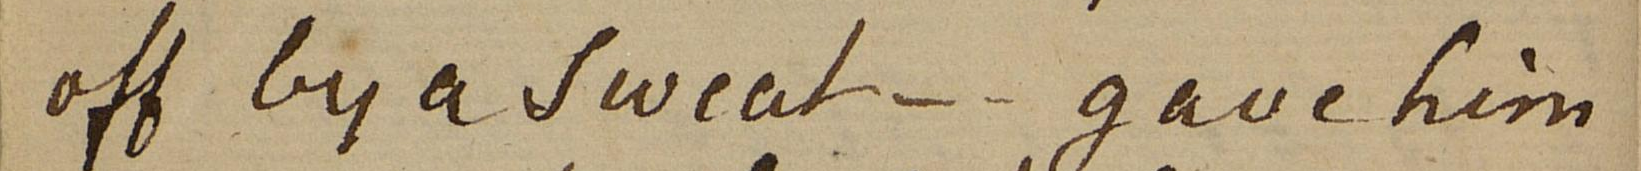off by a Sweat-- gave him
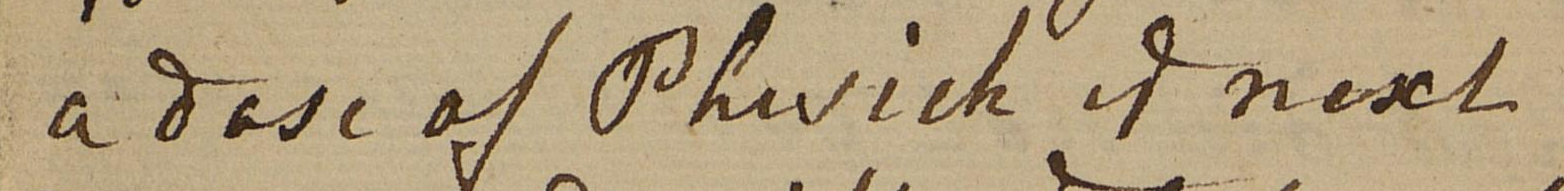a dose af Phisick y^e next
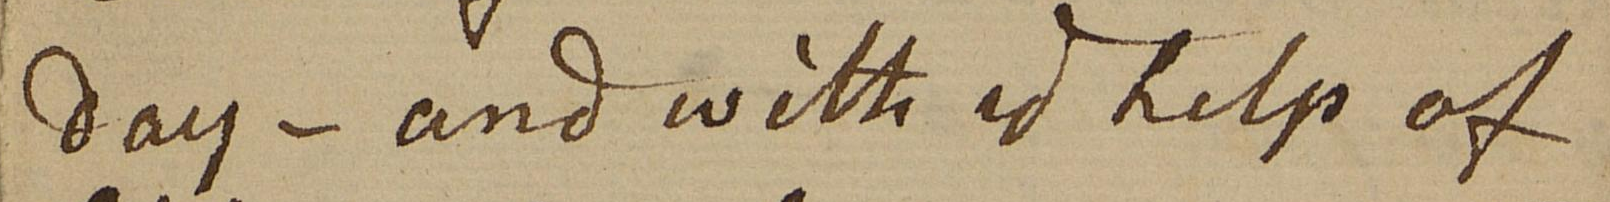day- and with y^e help of
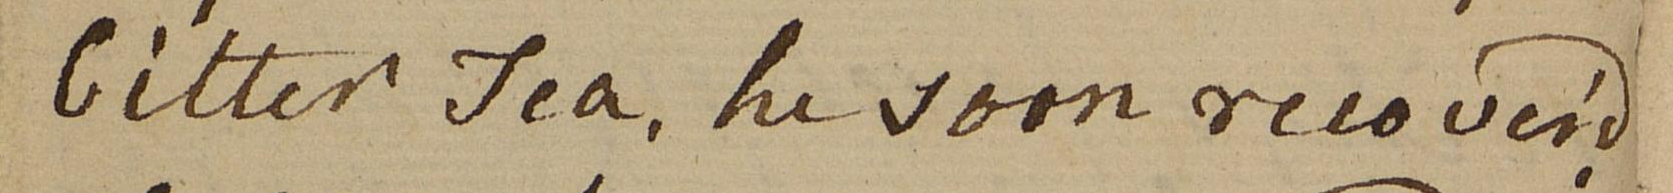bitter Tea, he soon recover'd
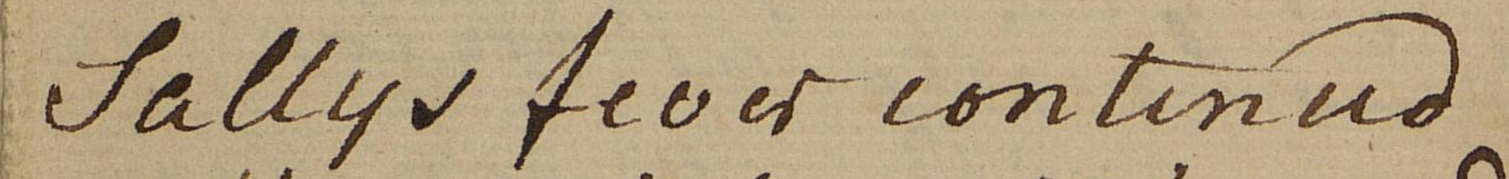Sallys fever continud
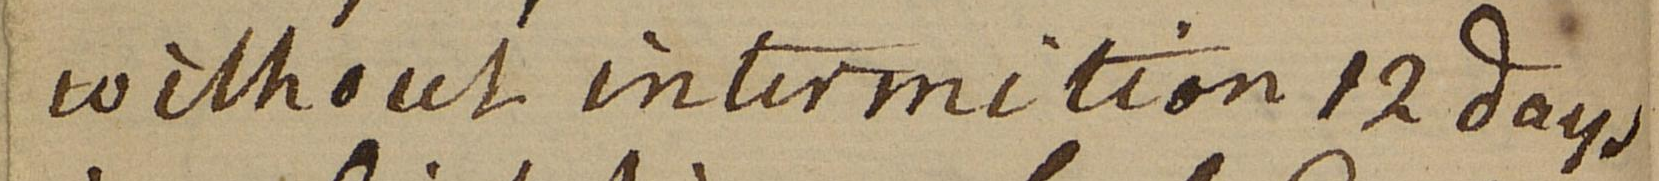without intermition 12 days
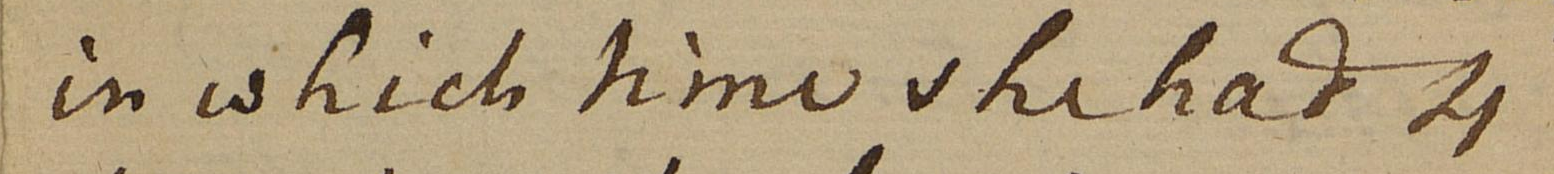in which time she had 4
